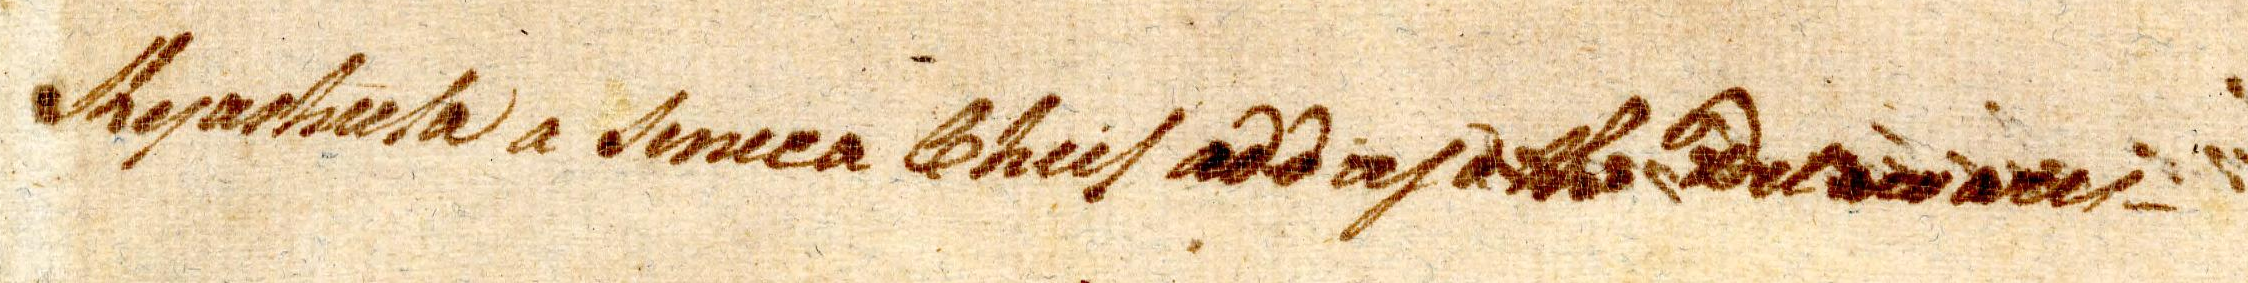Keyashuta a Seneca Chief address to the Delawares-
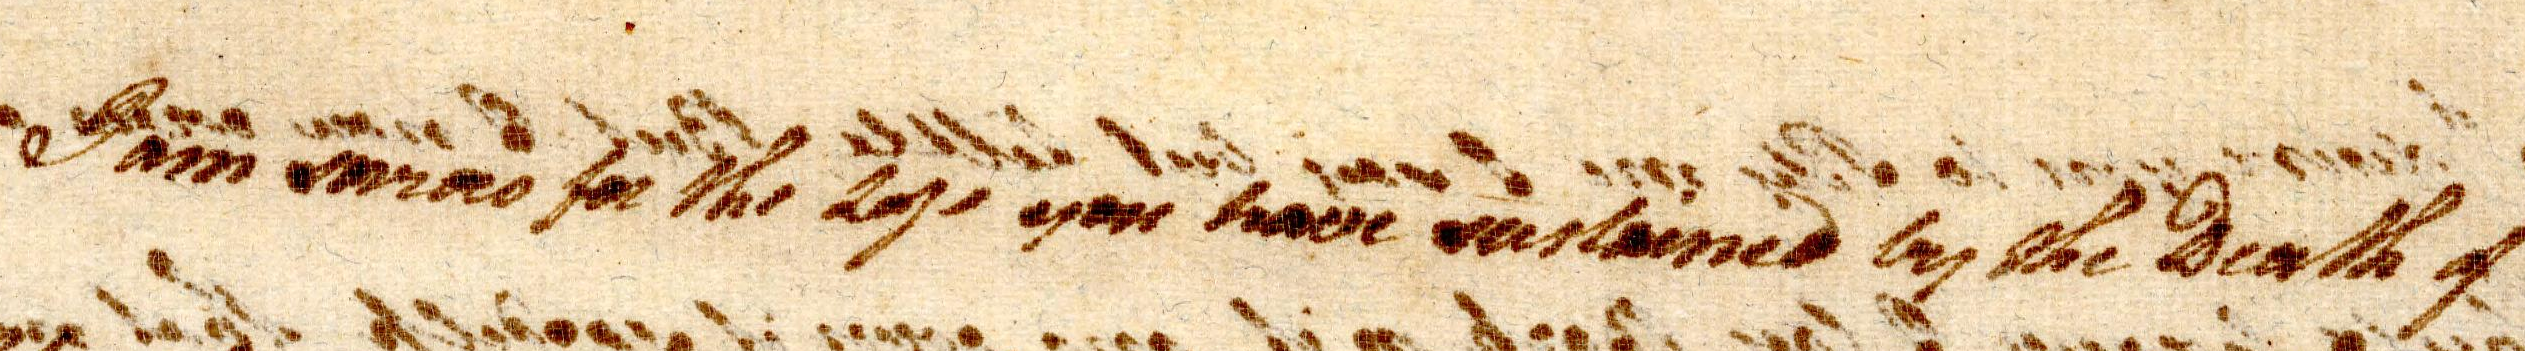I am sorry for the loss you have sustained by the Death of
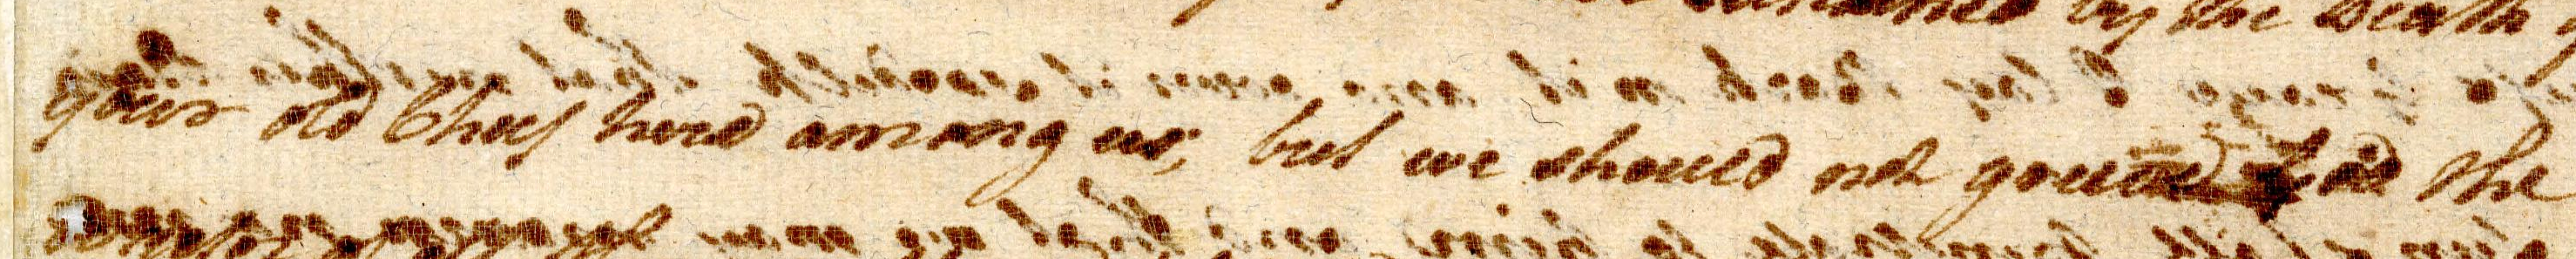your old Chief here among us; but we should not grieve for the
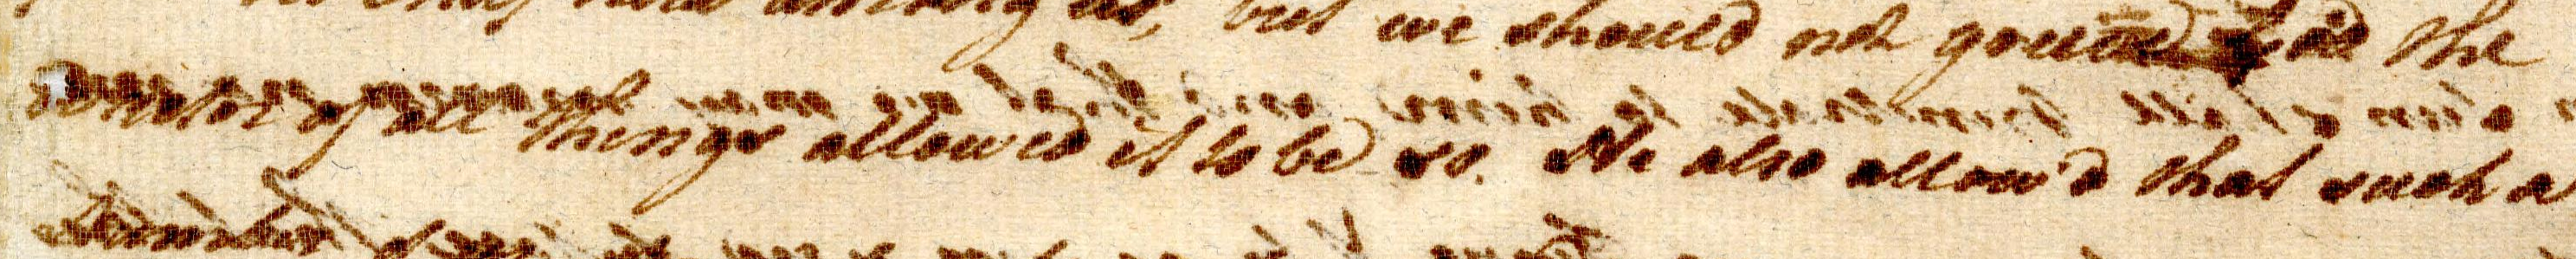creator of all things allowed it to be so. He also allow'd that such a
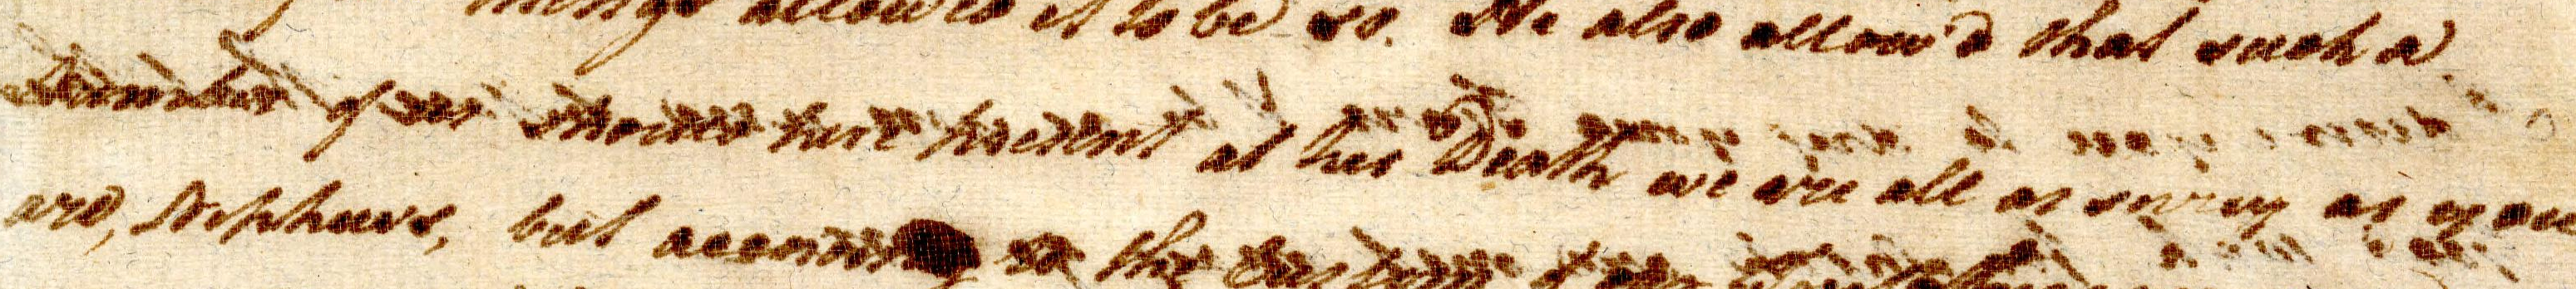Number of us should here present at his Death we are all as sorry as you
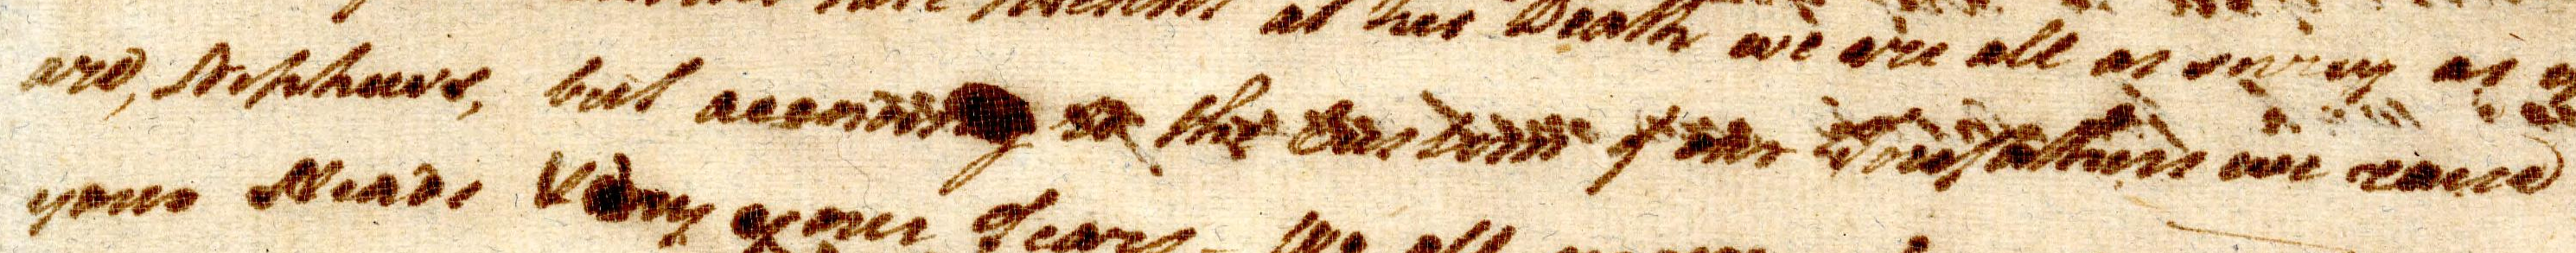are, Nephews, but according to the Custom of our Forefathers we raise
